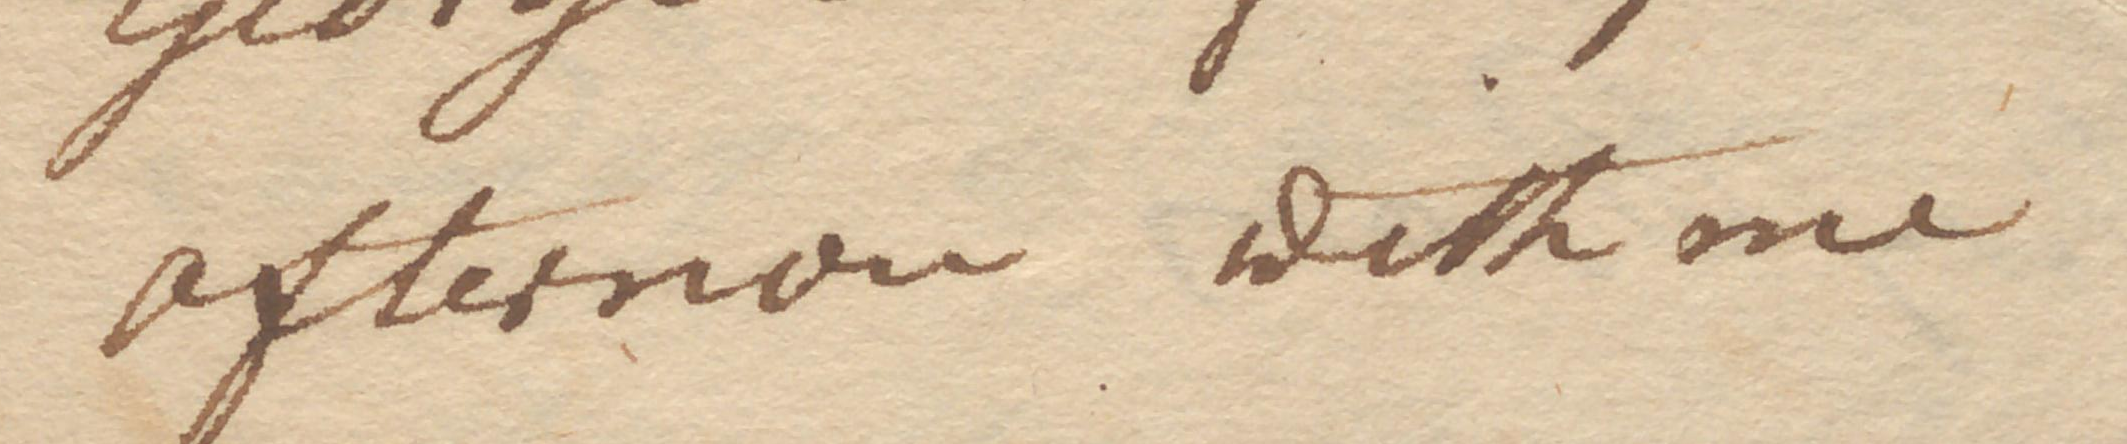afternon with me
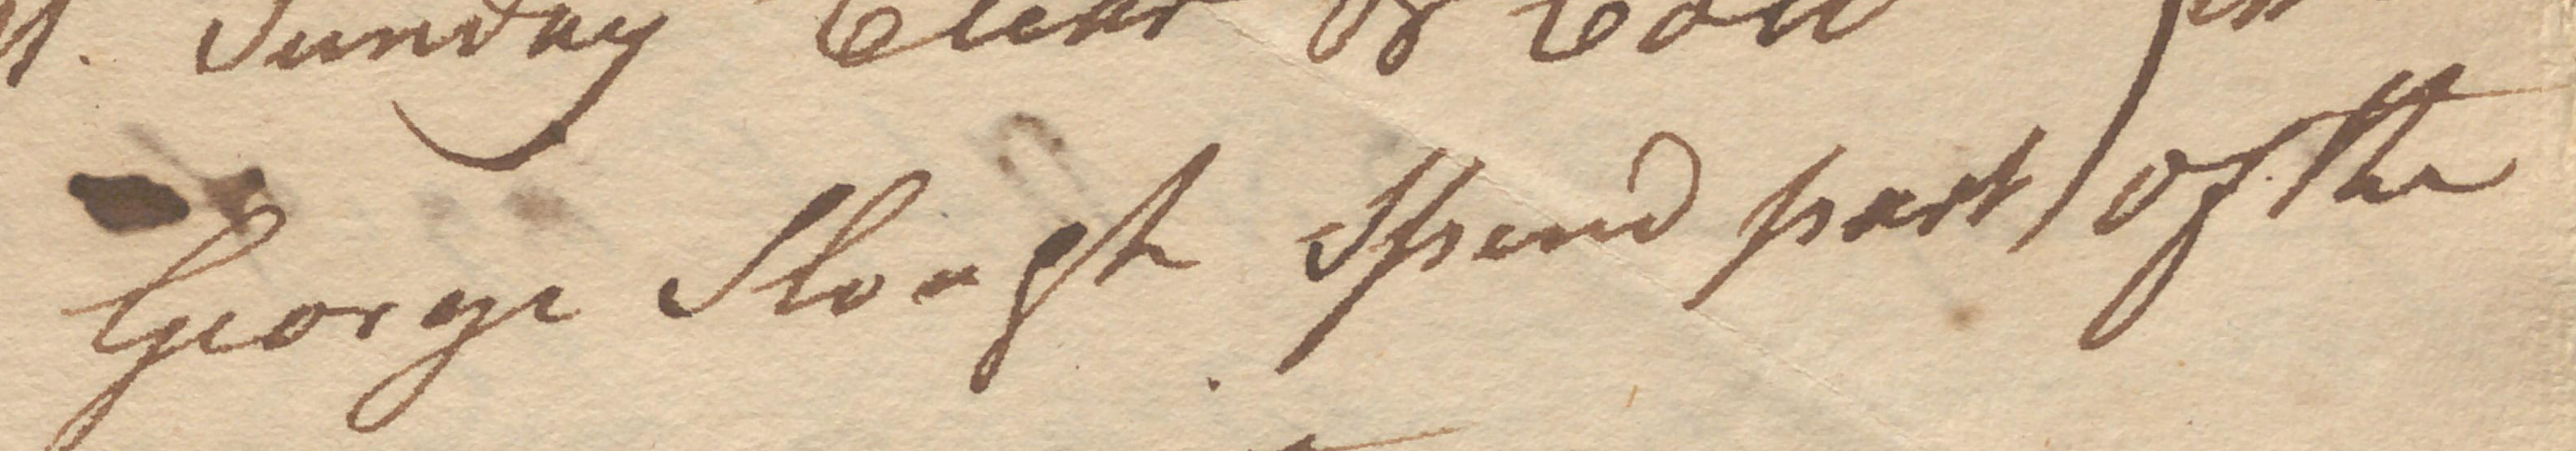George Slough spend part of the
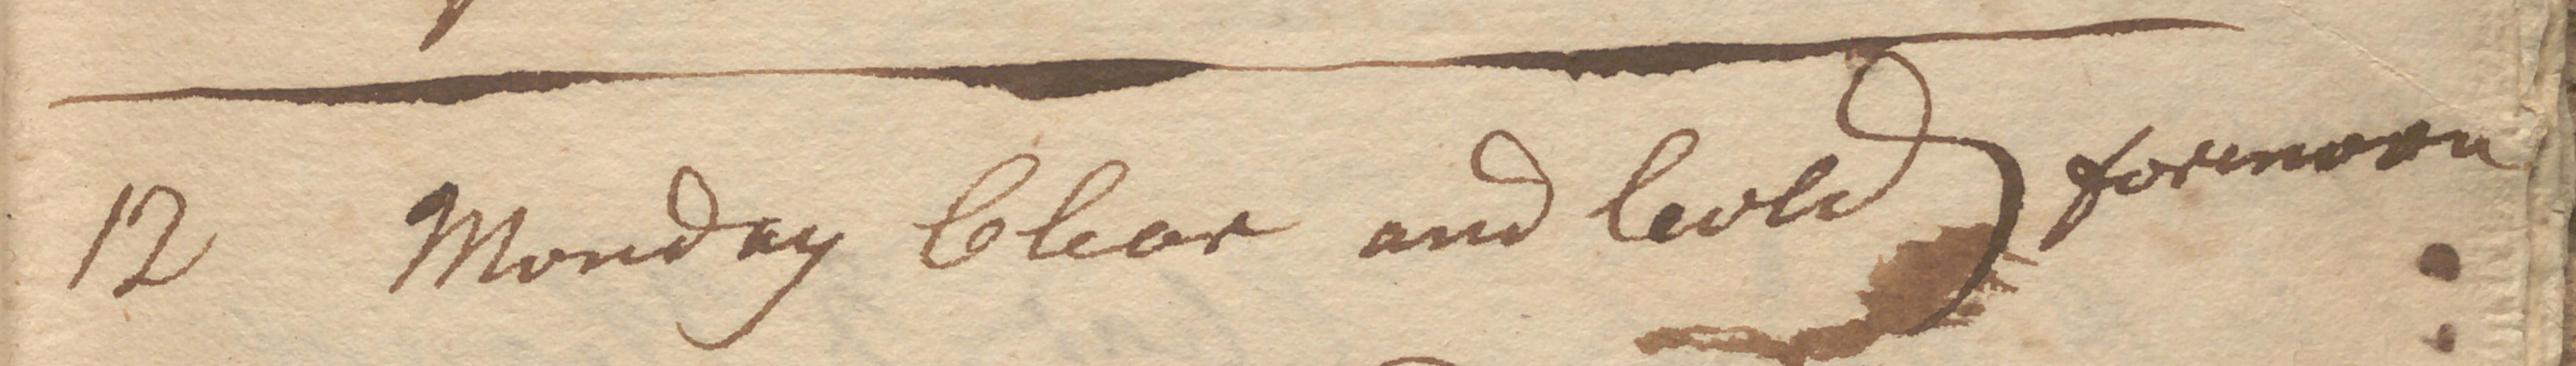12 Monday Clear and Cold forenoon
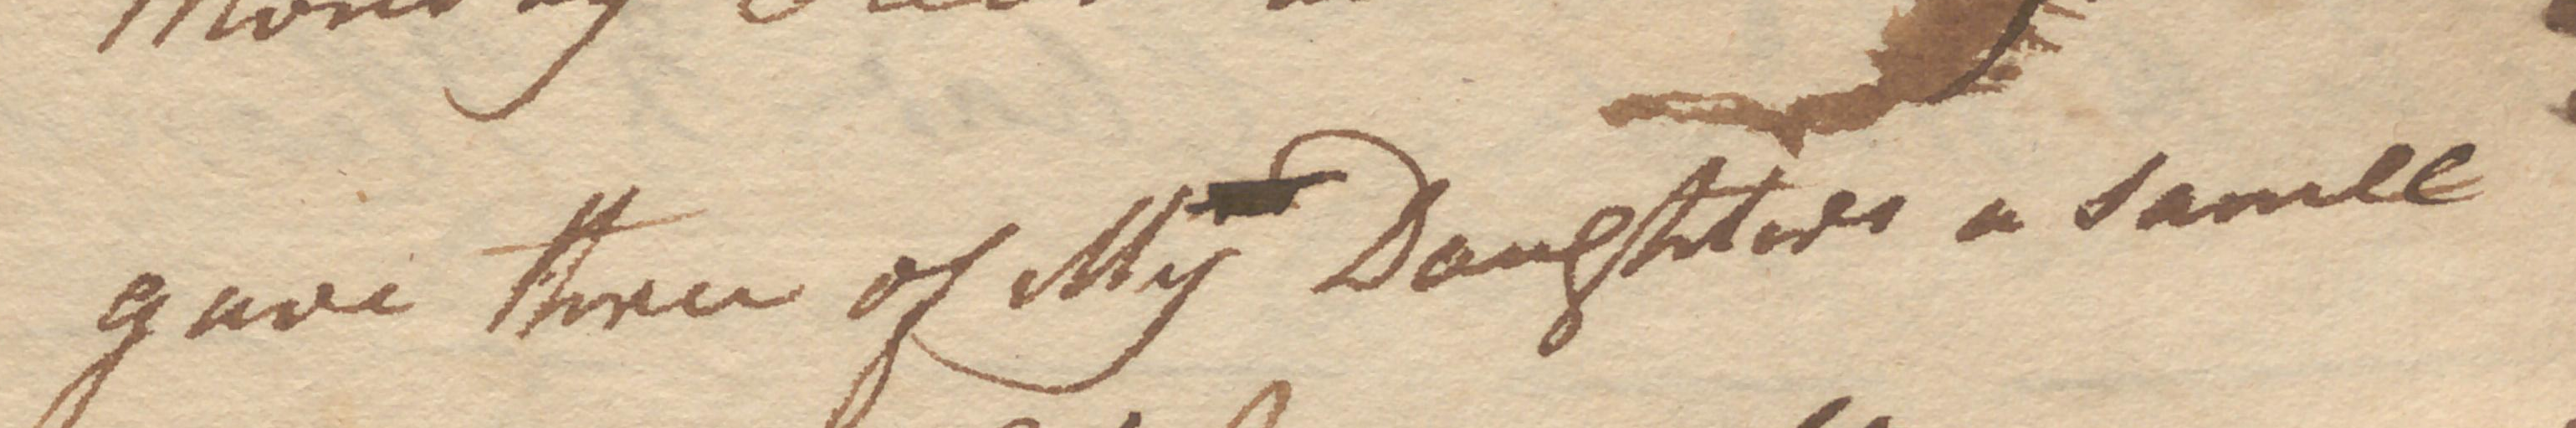gave three of My Daughters a samll
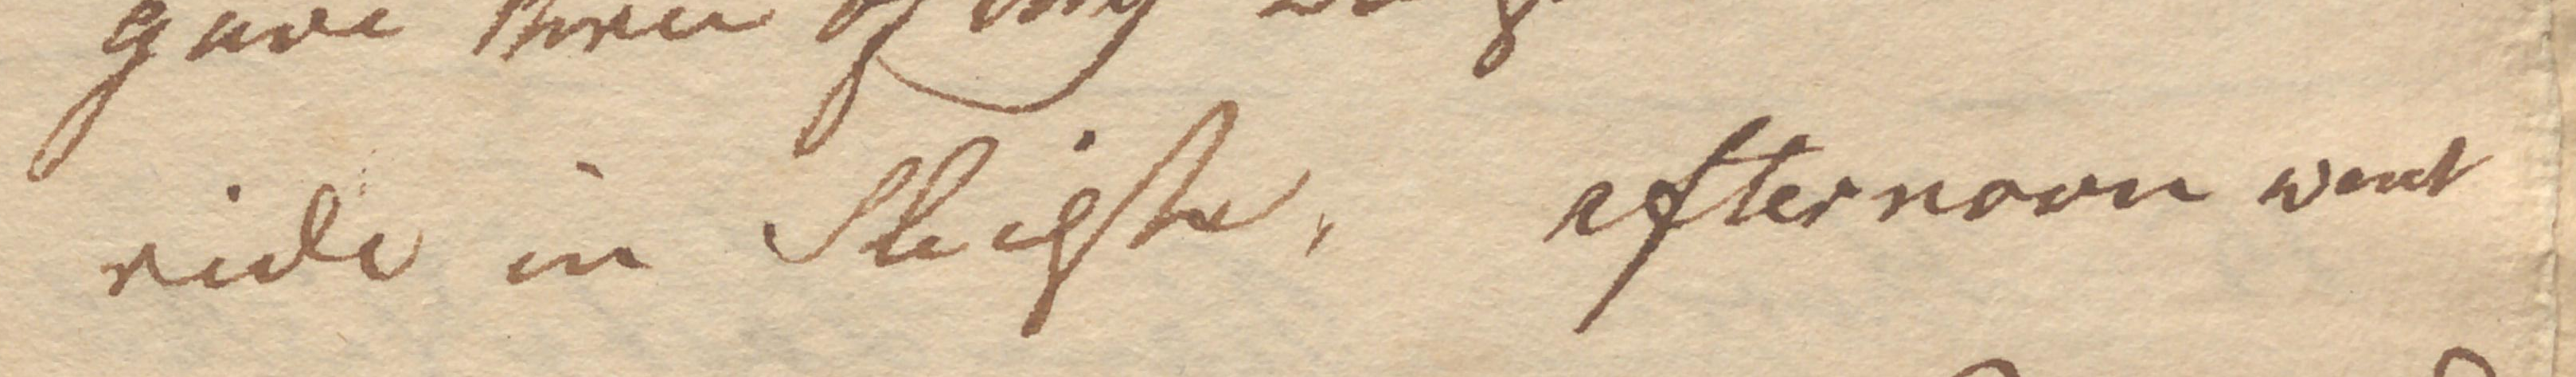ride in Sleigh, afternoon went
